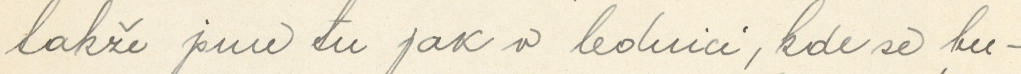takže jsme tu jak v lednici, kde se bu-
